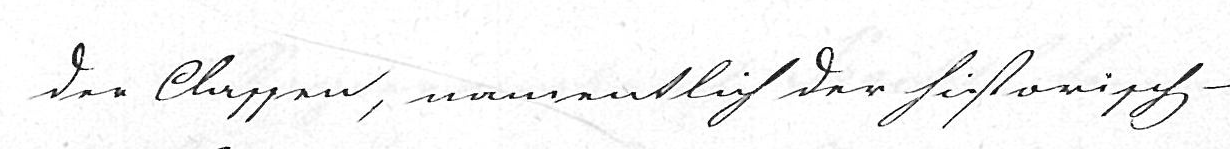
der Classen, namentlich der historisch-
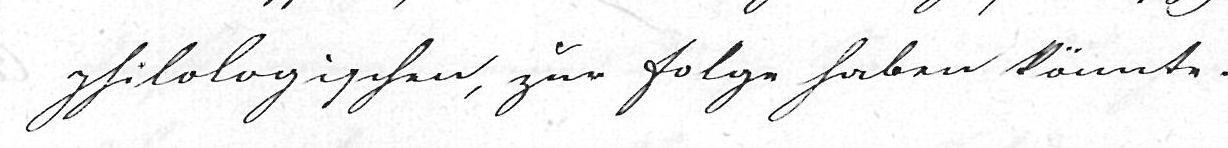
philologischen, zu Folge haben könnte.
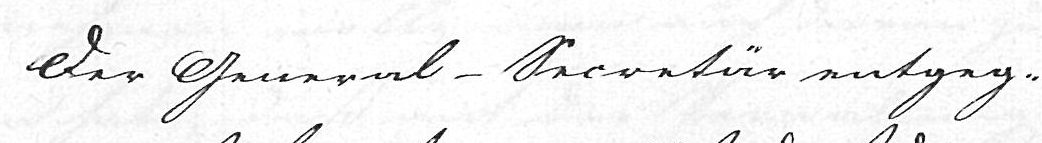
Der General-Secretär entgeg-
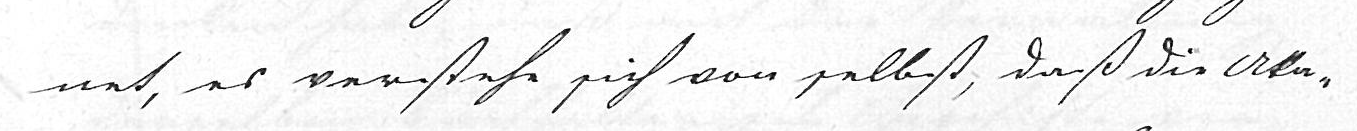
net, es verstehe sich von selbst, daß die Aka-
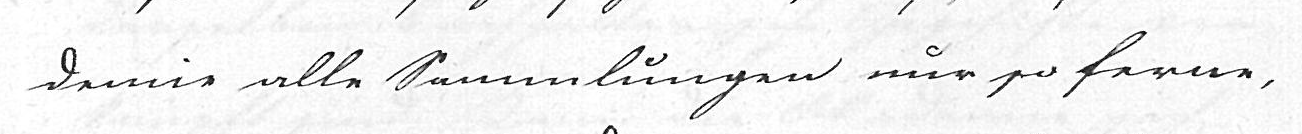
demie alle Sanmlungen nur so ferne,
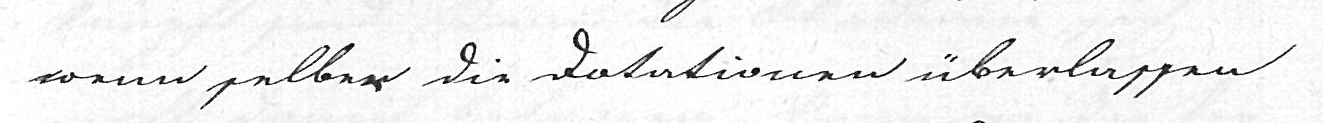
wenn selben die Dotationen überlassen
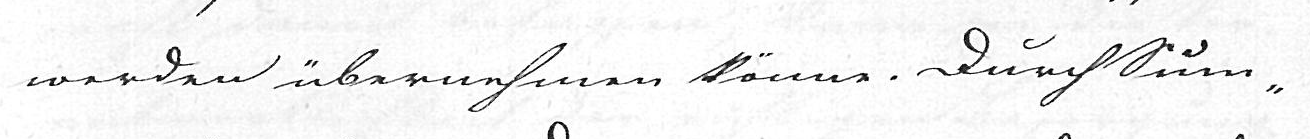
werden übernehmen könne. Durch Sum-
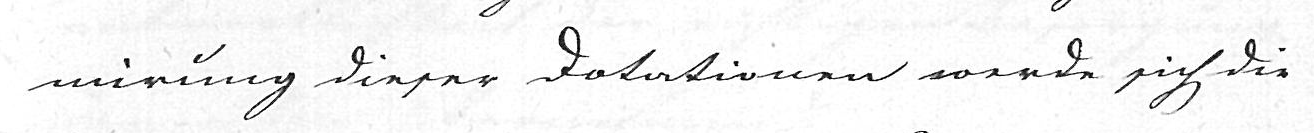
mirung dieser Dolationen werde sich die
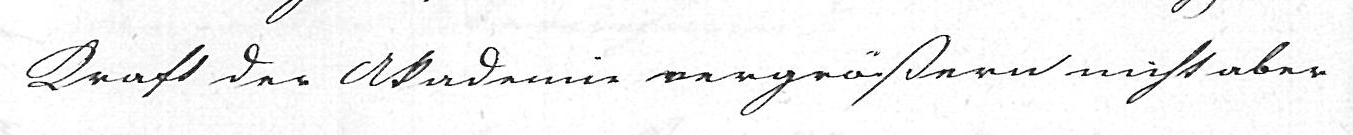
Kraft der Akademie vergrößern nicht aber
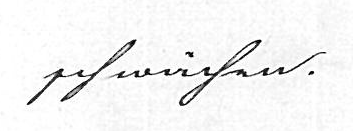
schwächen.
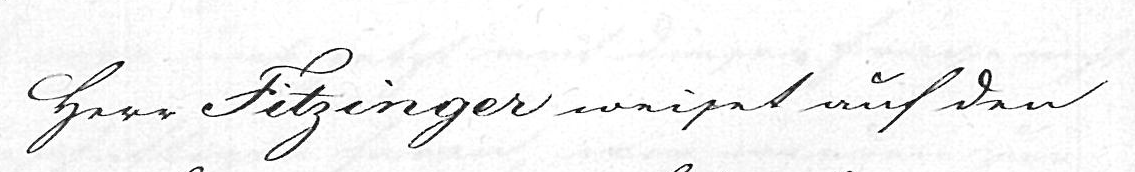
Herr Fitzinger weiset auf den
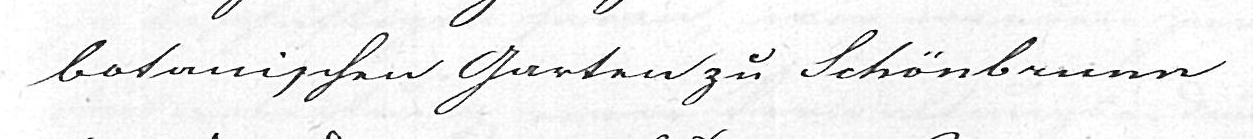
botanischen Garten zu Schönbrunn
